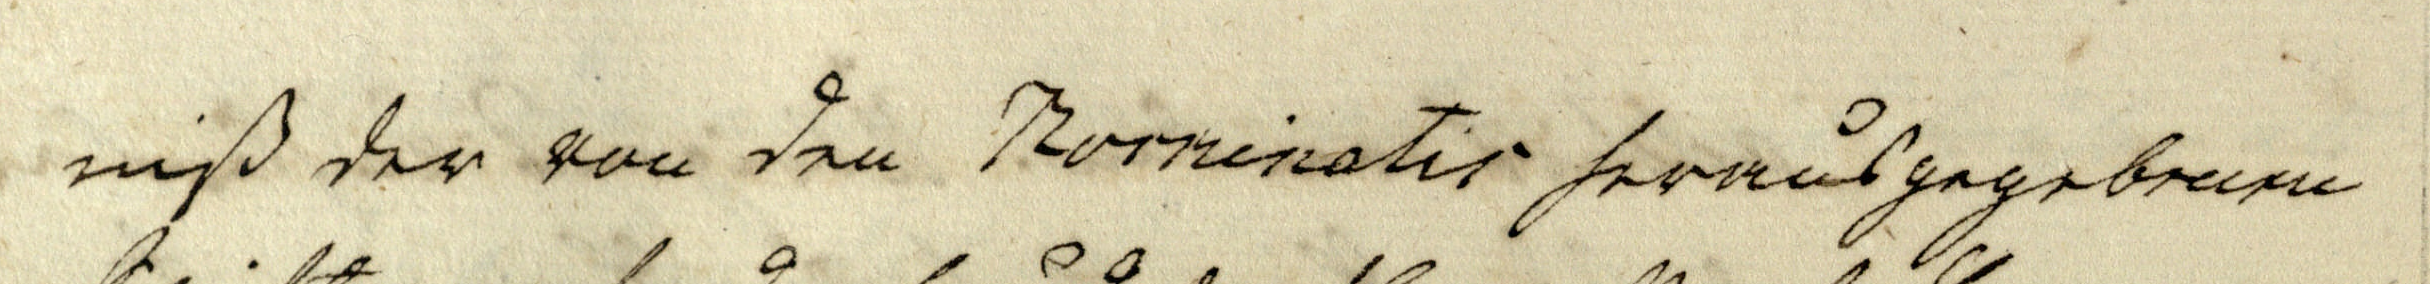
niß der von den Nominatis herausgegebenen
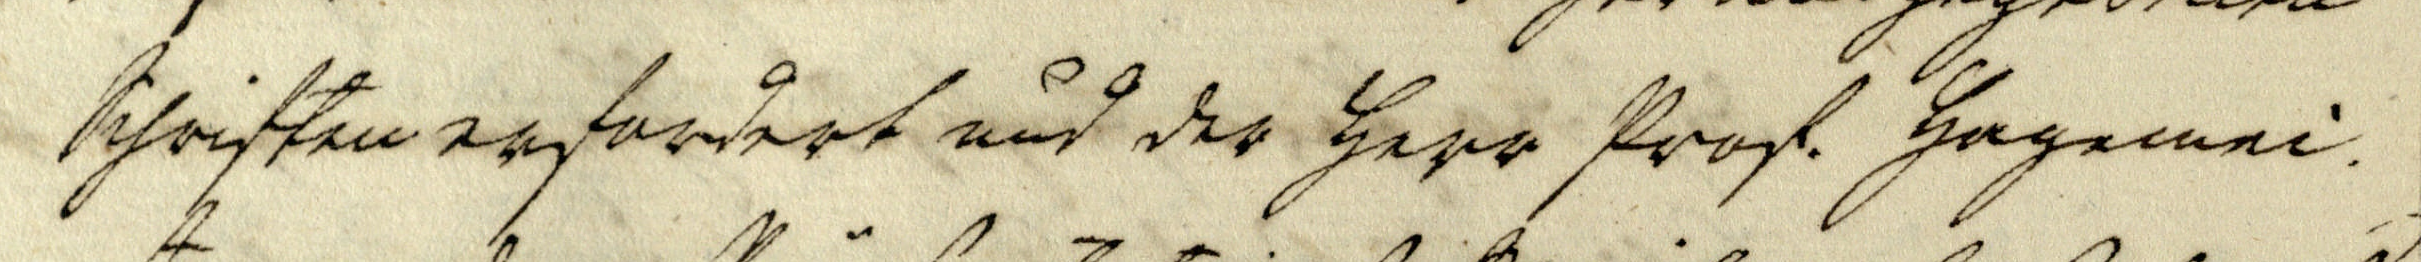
Schriften erfordert und der Herr Prof. Hagemei¬
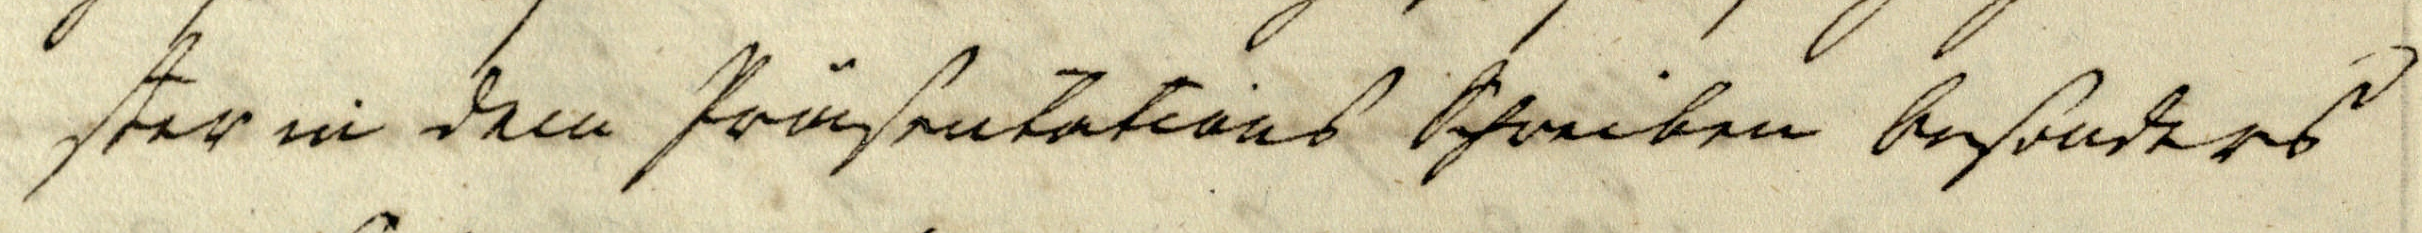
ster in dem Präsentations Schreiben besonders
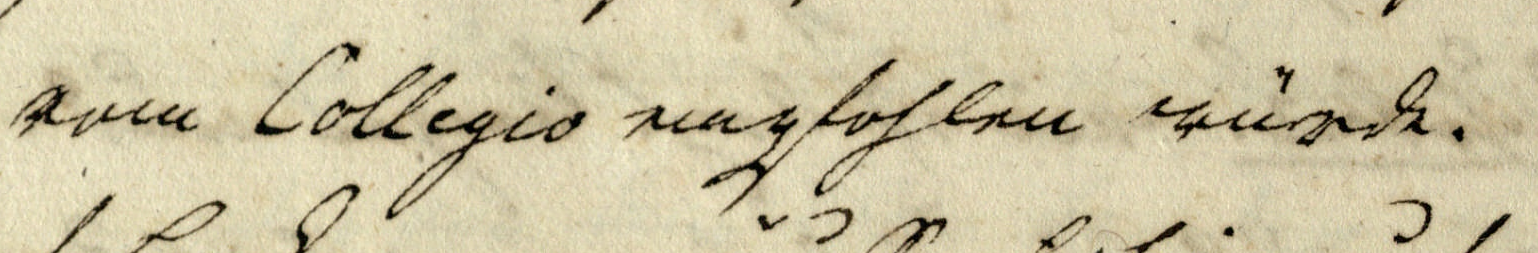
vom Collegio empfohlen würde.
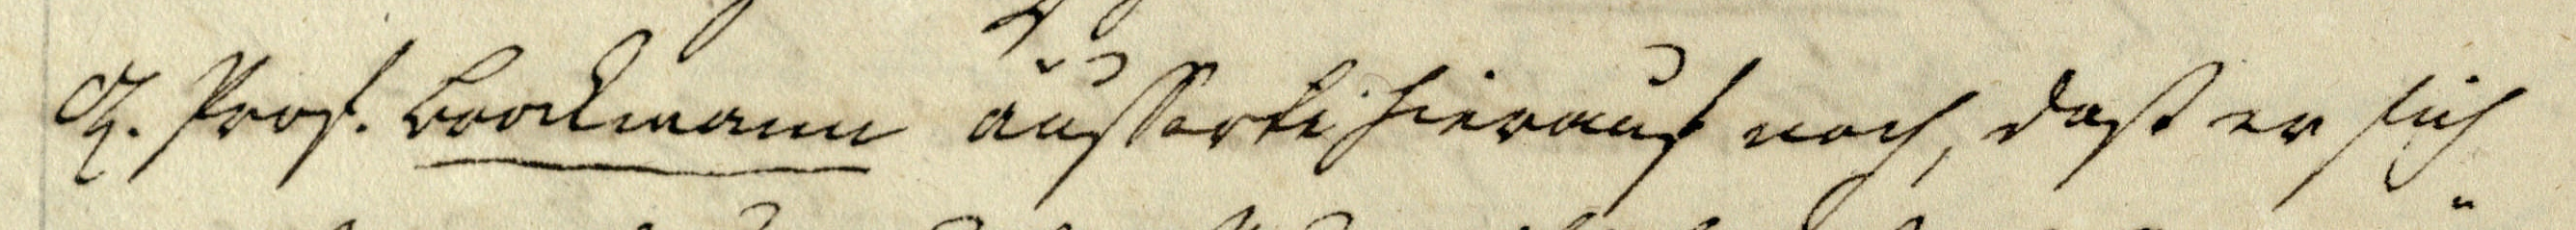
dh. Prof. Brockmann äusserte hierauf noch, daß er sich
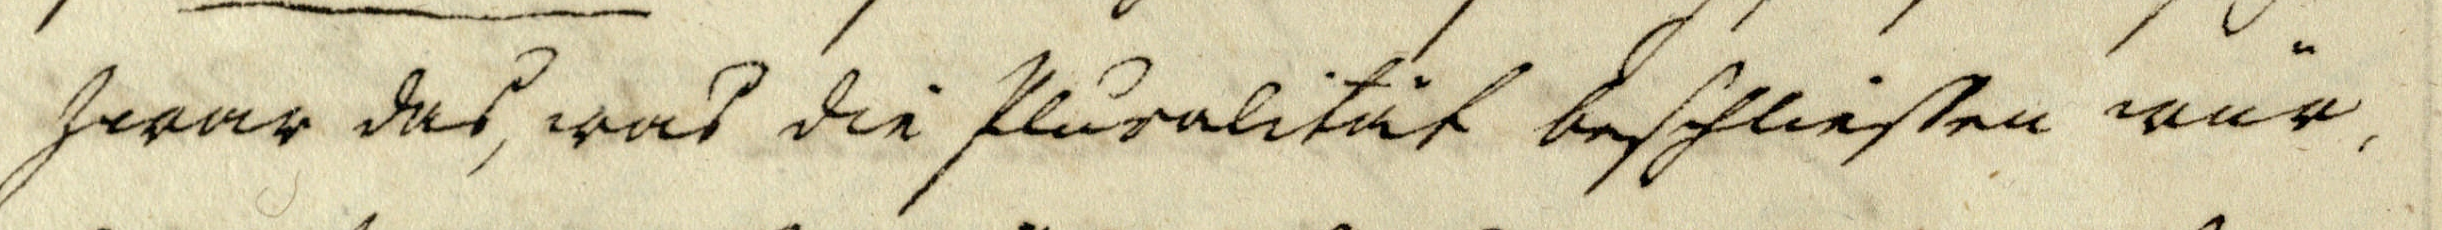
zwar das, was die Pluralität beschliessen wür¬
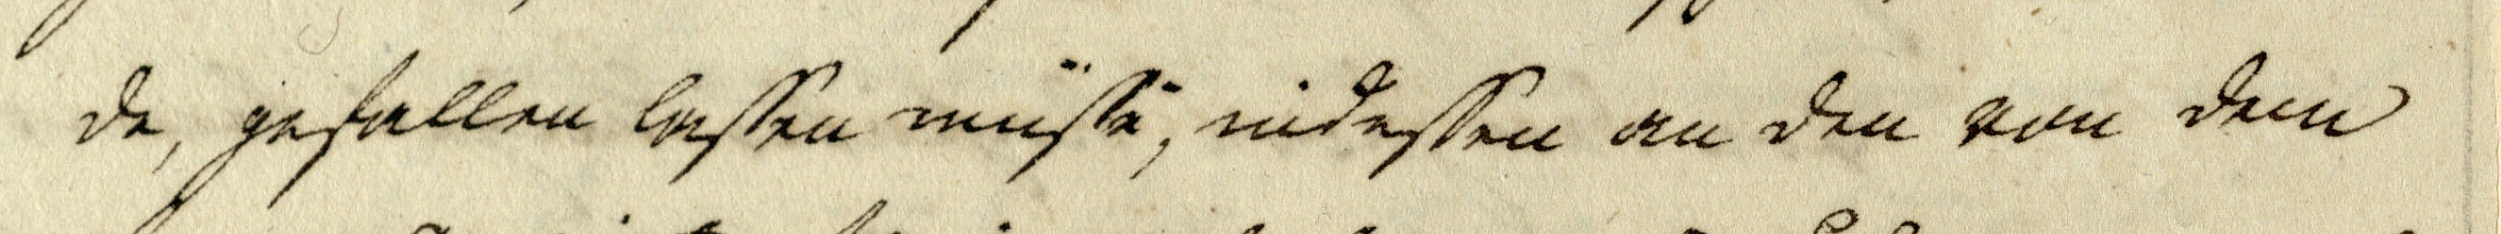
de, gefallen lassen müsse, indessen an den von dem
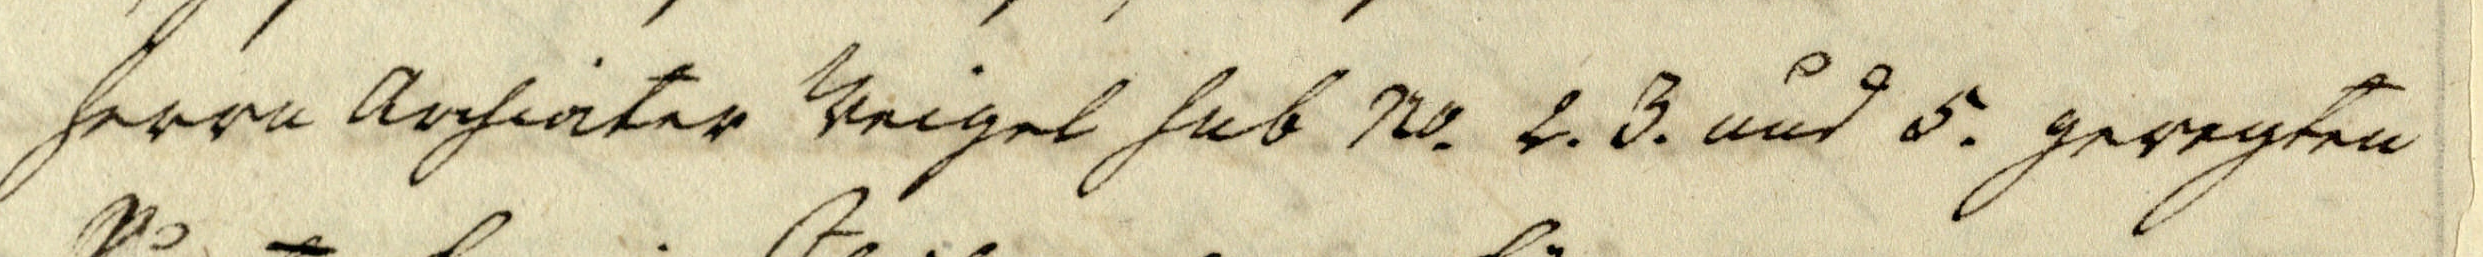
Herrn Archiater Weigel sub No. 2. 3. und 5. geregten
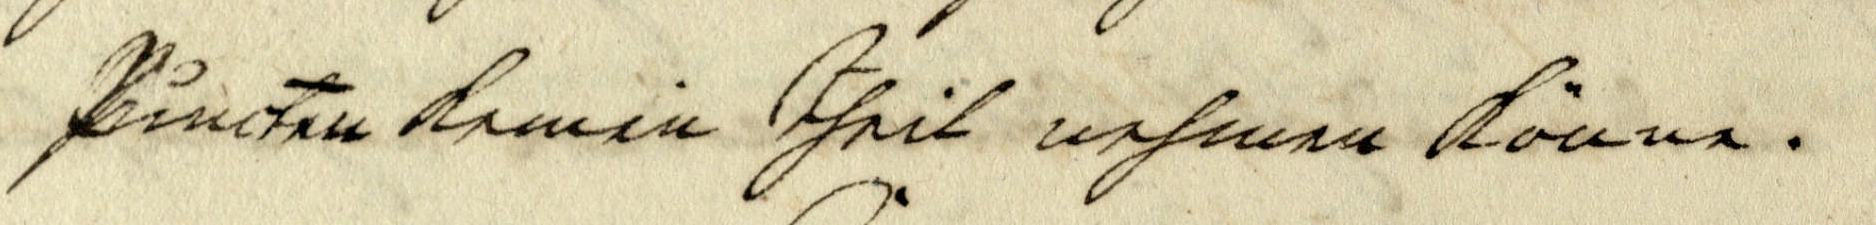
Puncten keinen Theil nehmen könne.
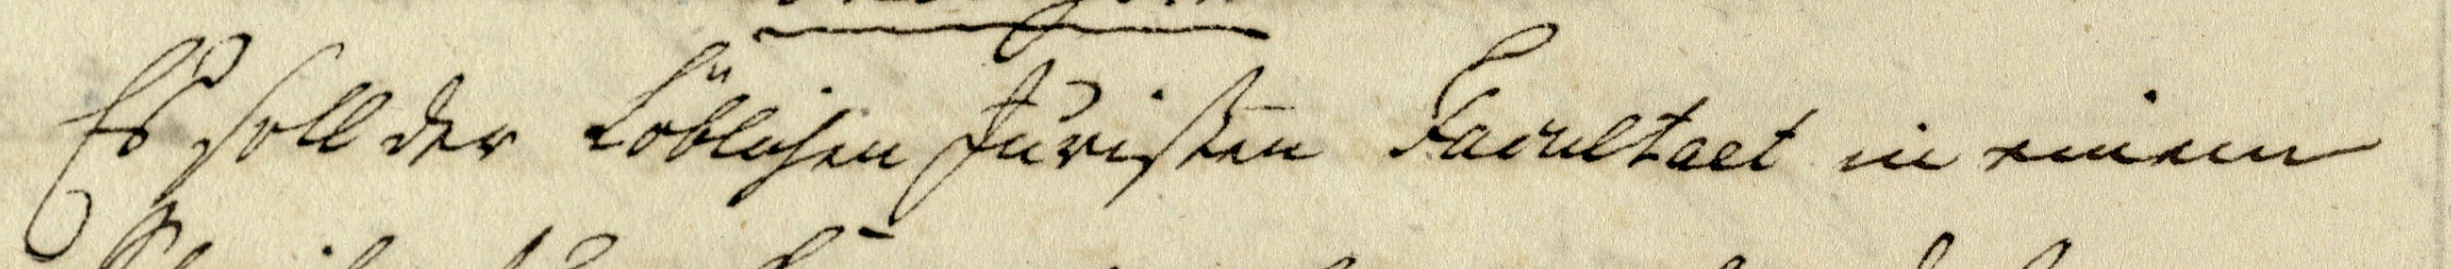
Es soll der Löblichen Juristen Facultaet in einem
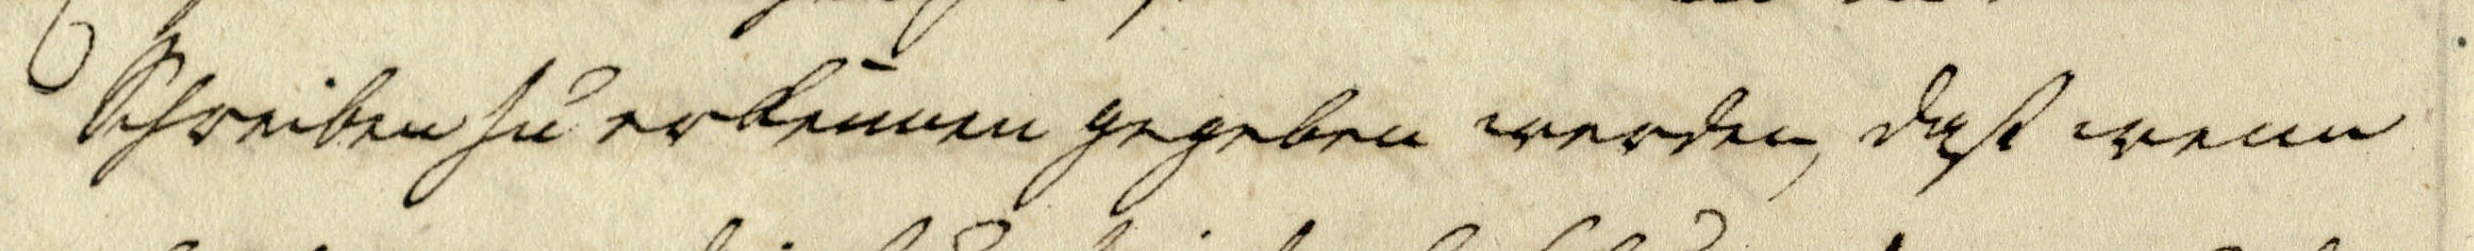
Schreiben zu erkennen gegeben werden, daß wenn
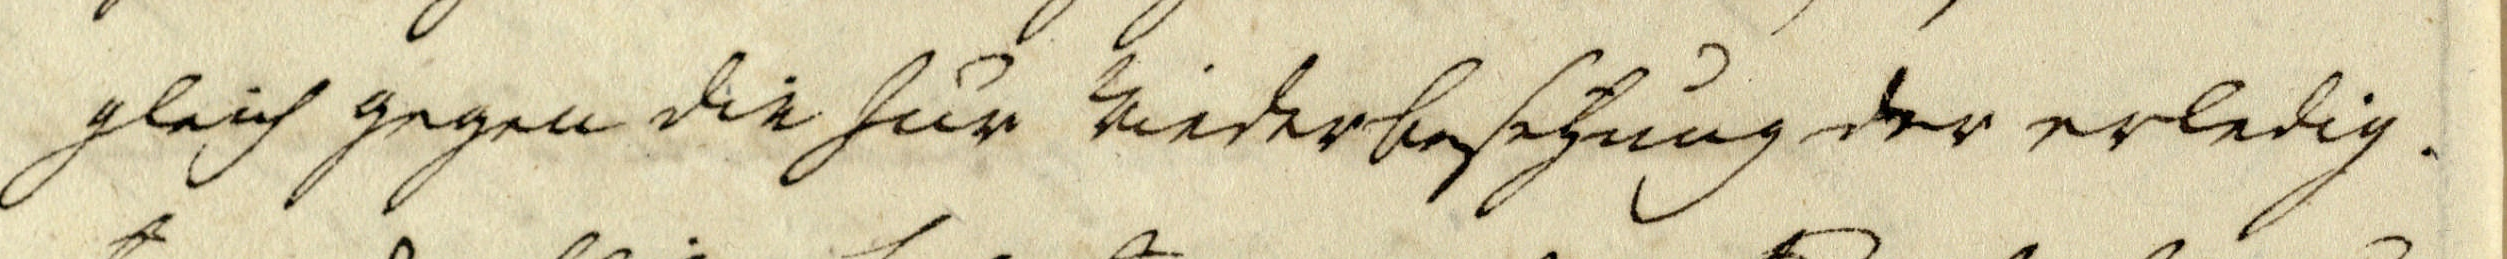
gleich gegen die zur Wiederbesetzung der erledig¬
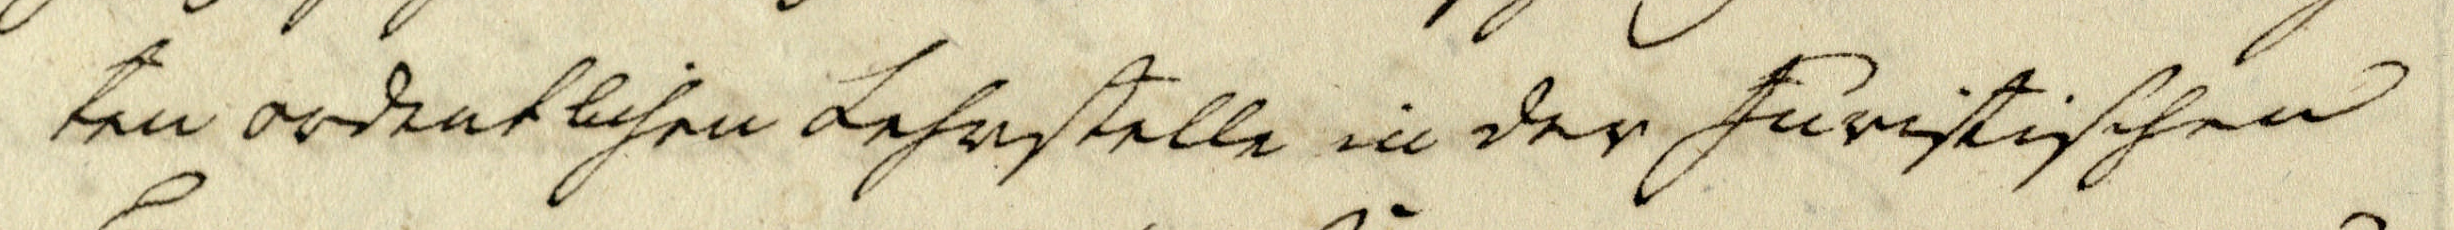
ten ordentlichen Lehrstelle in der Juristischen
